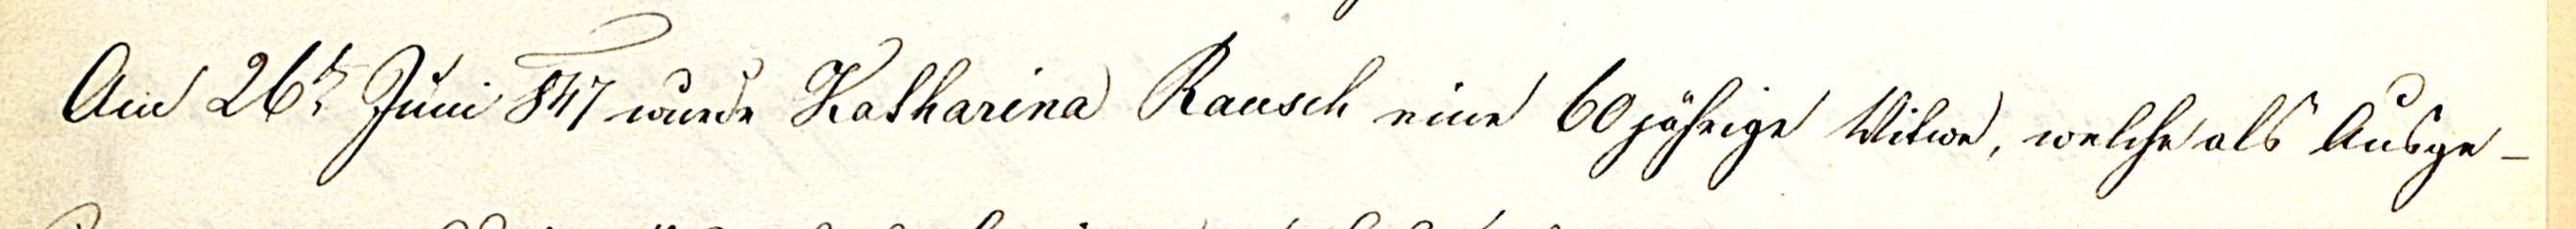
Am 26. Juni 847 wurde Katharina Rausch eine 60jährige Witwe, welche als Ausge¬
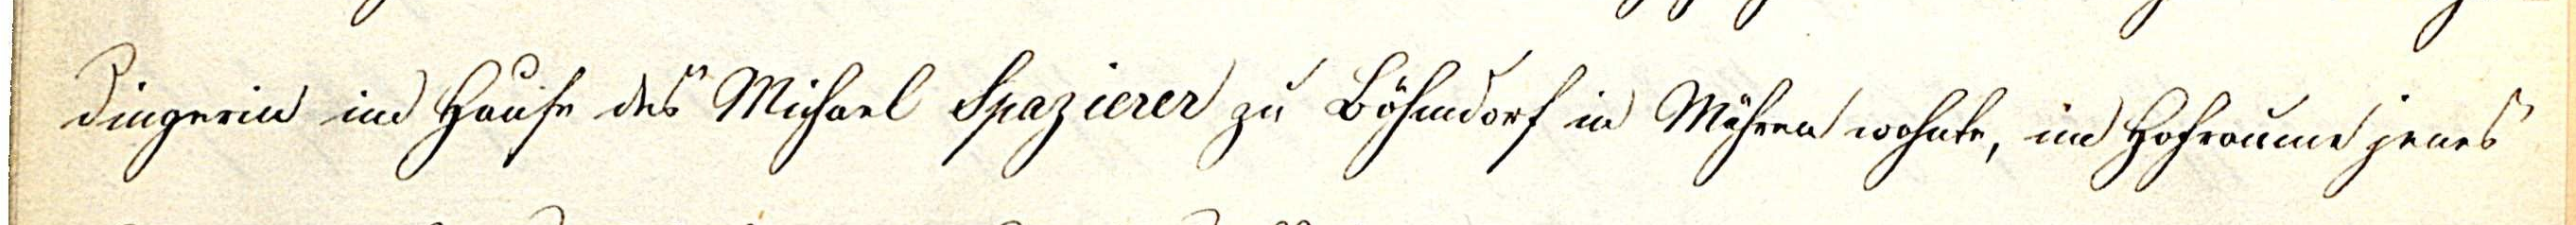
dingerin ins Hause des Michael Spazierer zu Böhmdorf in Mähren wohnte, im Hofraume jenes
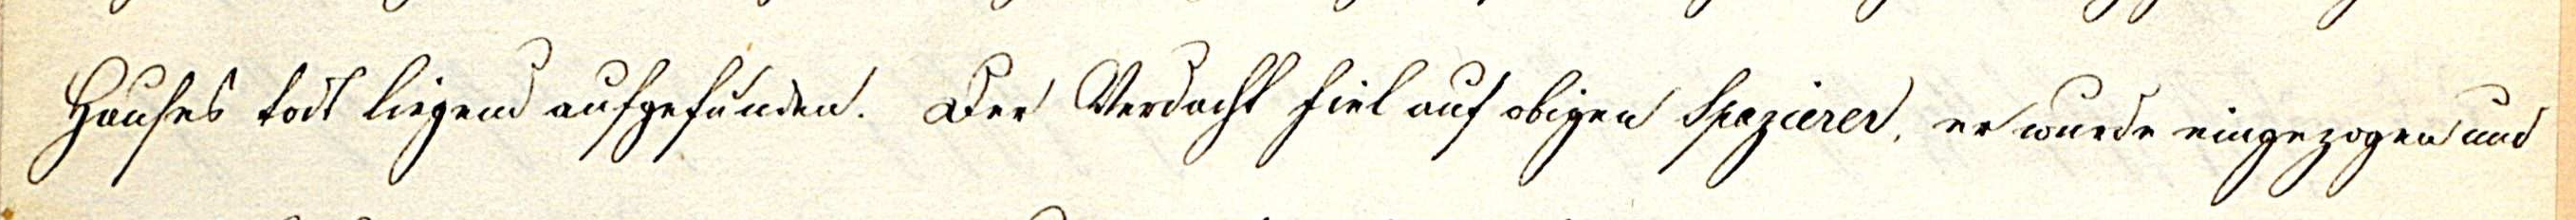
Hauses todt liegend aufgefunden. Der Verdacht fiel auf obigen Spazierer, er wurde eingezogen und
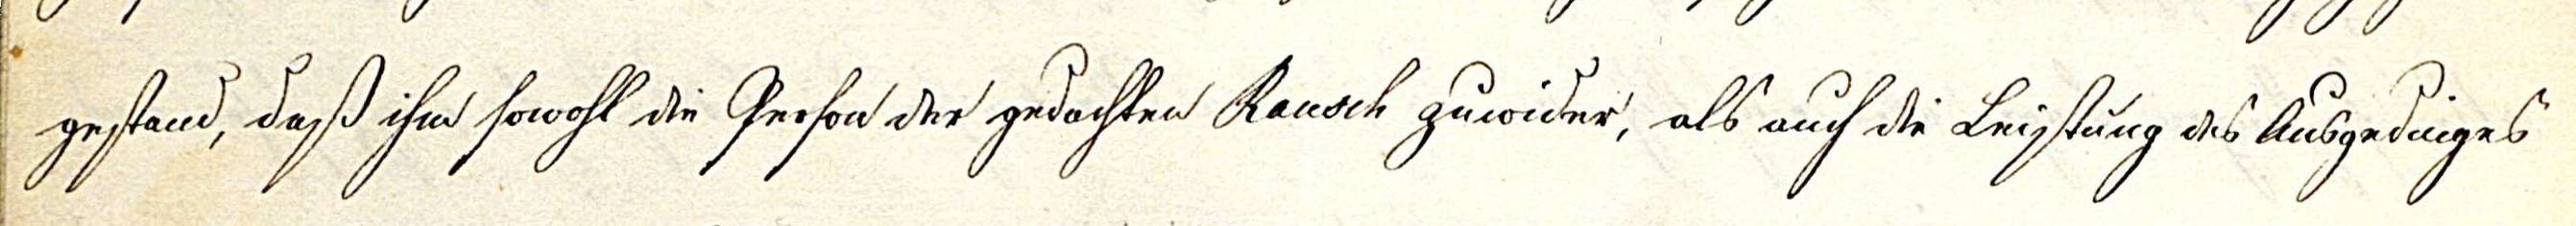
gestand, daß ihm sowohl die Person der gedachten Rausch zuwider, als auch die Leistung des Ausgedinges
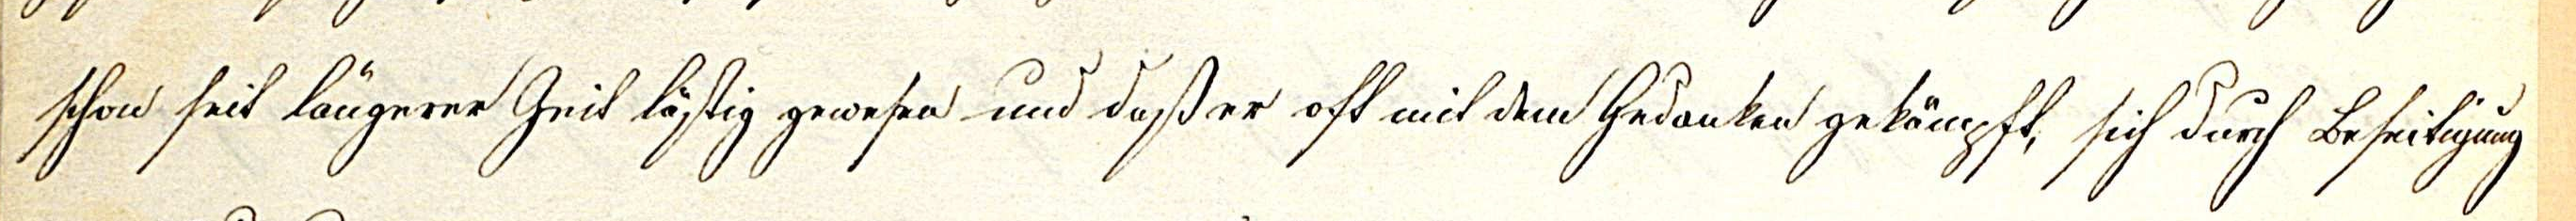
schon seit längerer Zeit lästig gewesen und daß er oft mit dem Gedanken gekämpft, sich durch Beseitigung
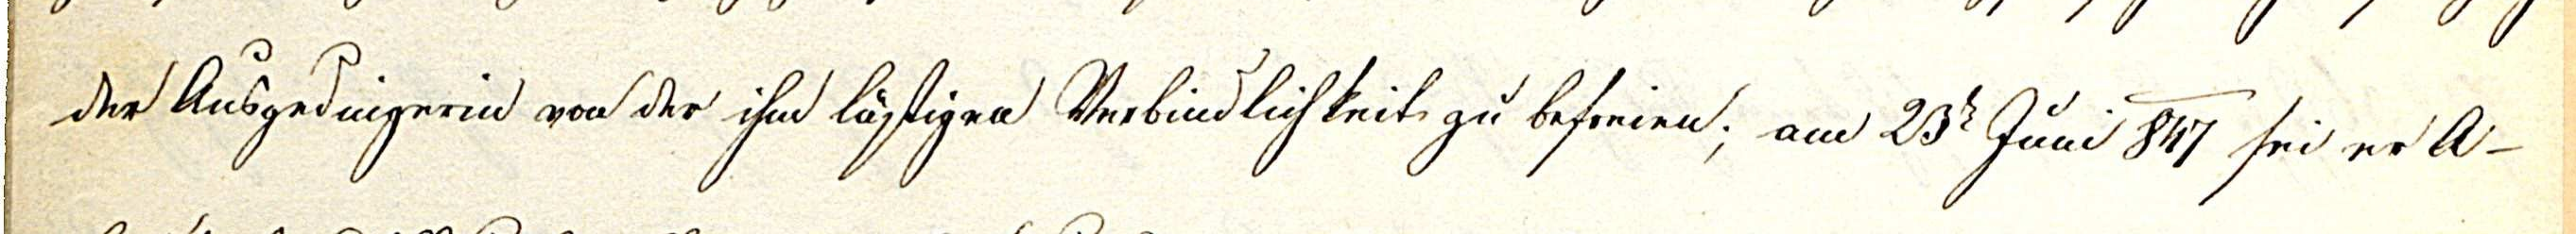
der Ausgedingerin von der ihm lästigen Verbindlichkeit zu befreien; am 23ten Juni 847 seit er A¬
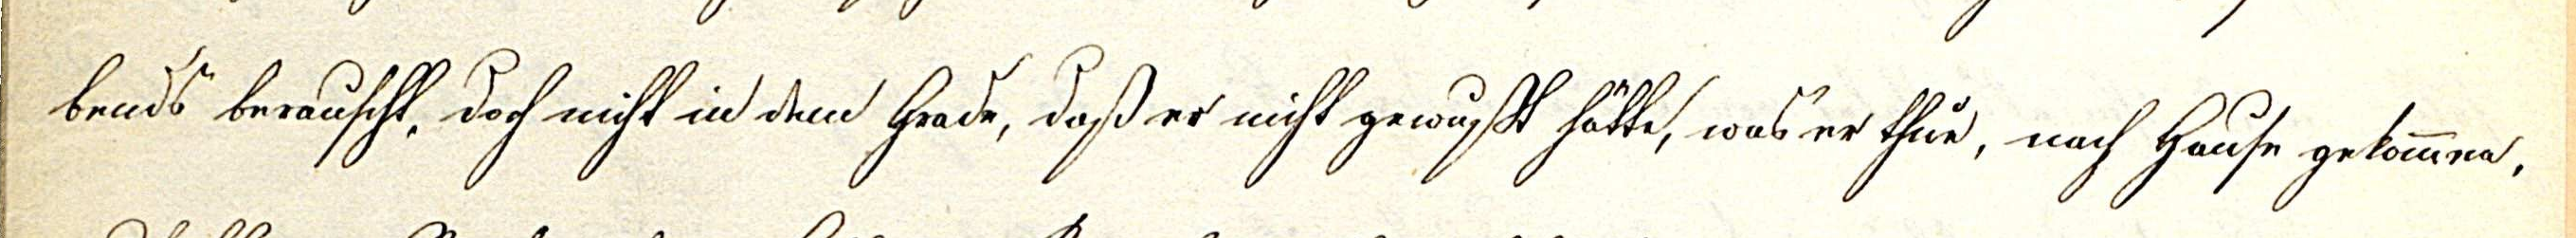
bends berauscht, doch nicht in dem Grade, daß er nicht gewußt hätte, was er thun, nach Hause gekommen,
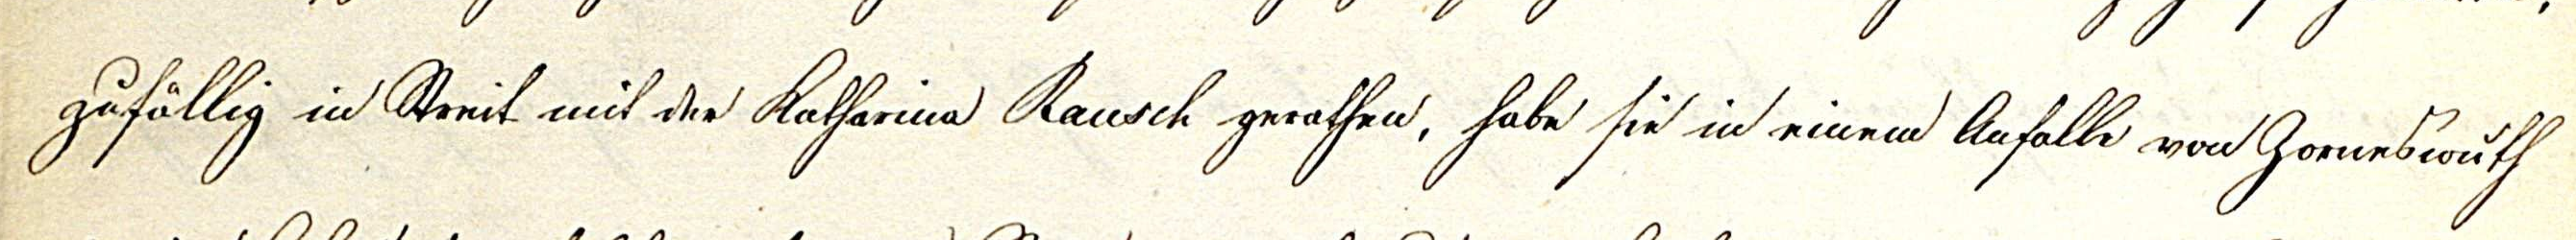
gefällig in Streit mit der Katharina Rausch gerathen, habe sie in einem Anfalle von Zorneswuth
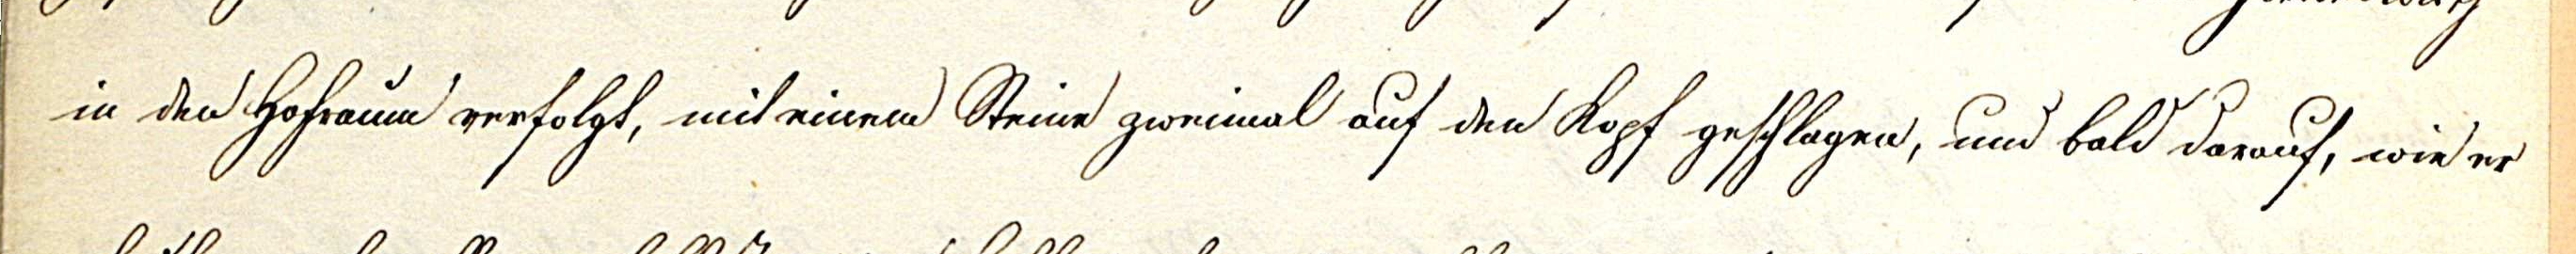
in den Hofraum verfolgt, mit einem Steine zweimal auf den Kopf geschlagen, und bald darauf, wie er
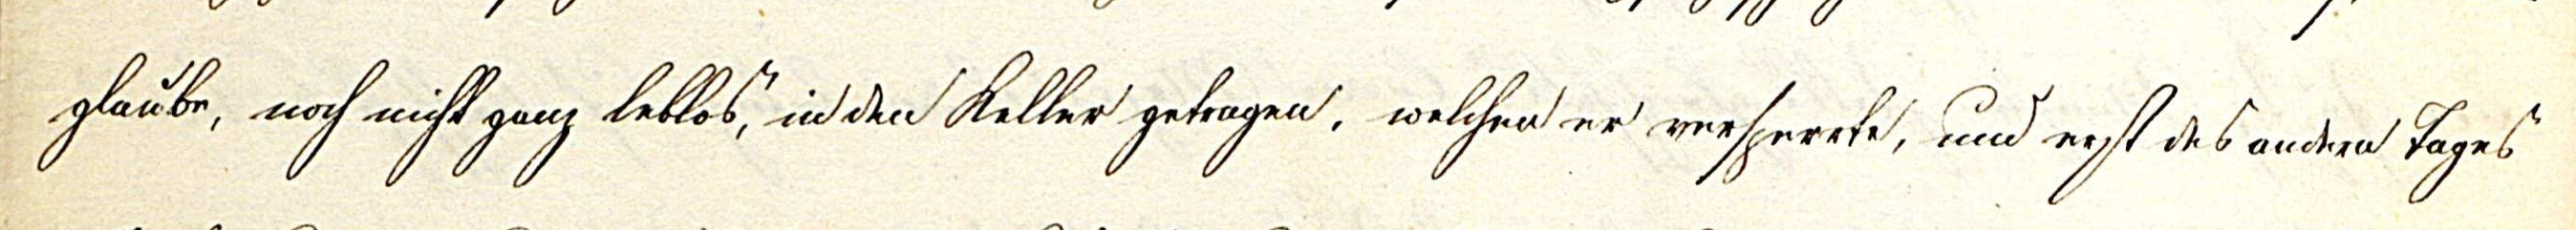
glaube, noch nicht ganz leblos, in den Keller getragen, welchen er versperrte, und erst des anderen Tages
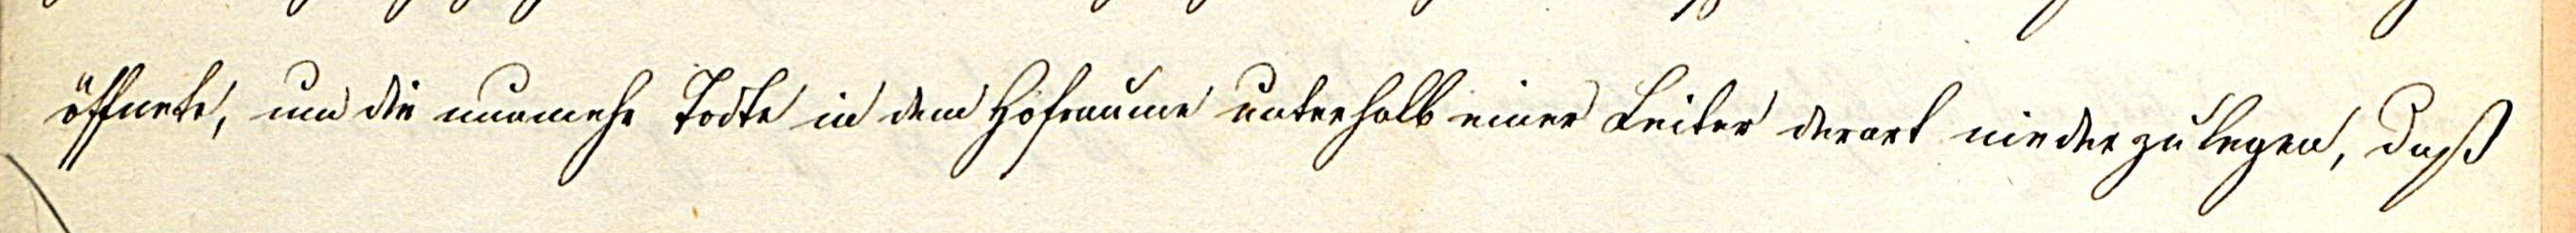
öffnete, um die nunmehr Todte in dem Hofraume unterhalb einer Leiter derart nieder zu legen, daß
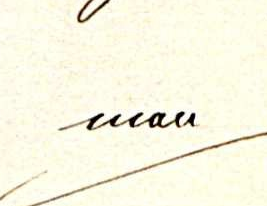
man
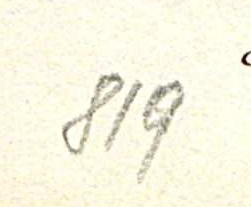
819
